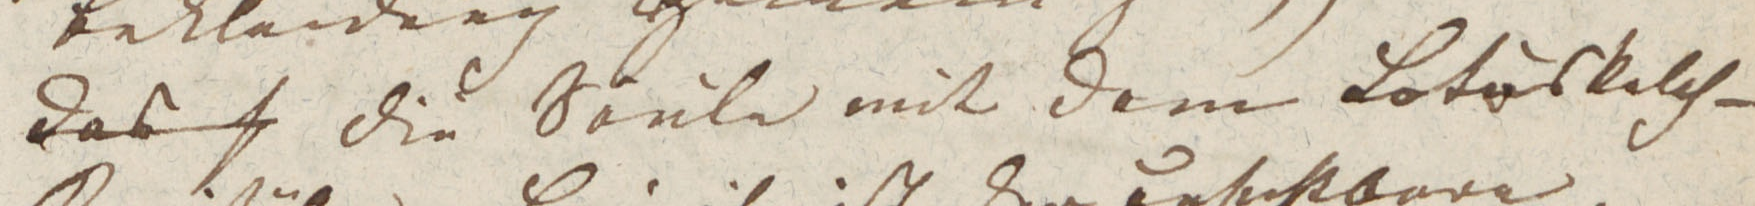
das s die Säule mit dem Lotuskelch-
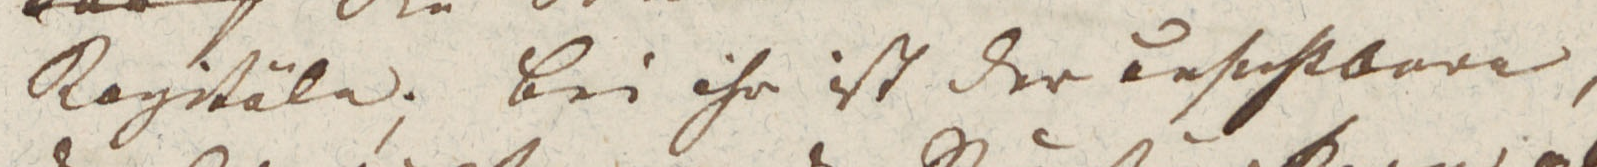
Kapitäle; Bei ihr ist der unsichtbare,
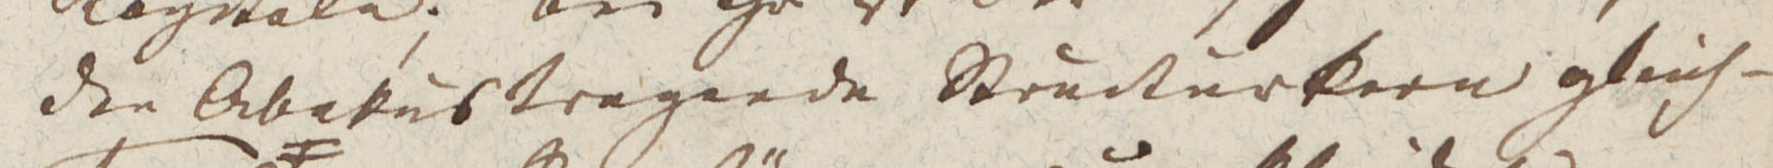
der Abakustragende Structurkern gleich-
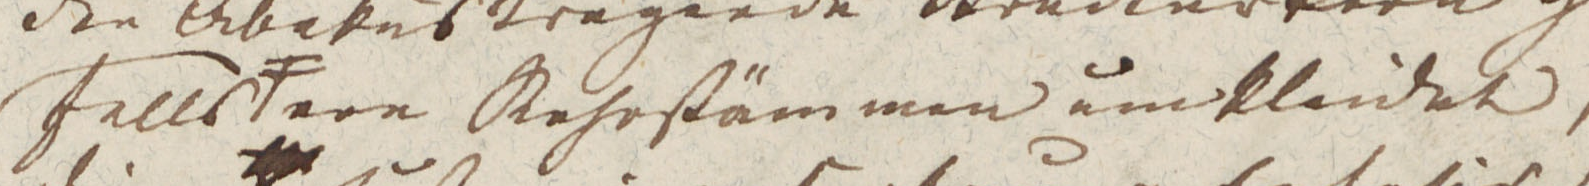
falls % von Rohrstämmen umkleidet,
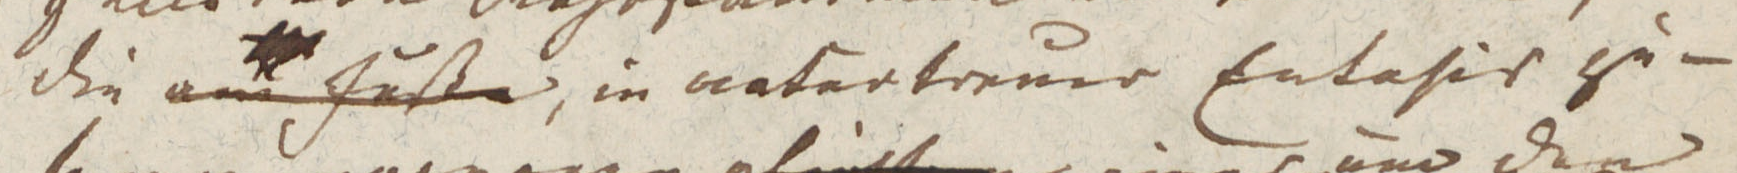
die am Fusse%, in naturtreuer Entasis zu-
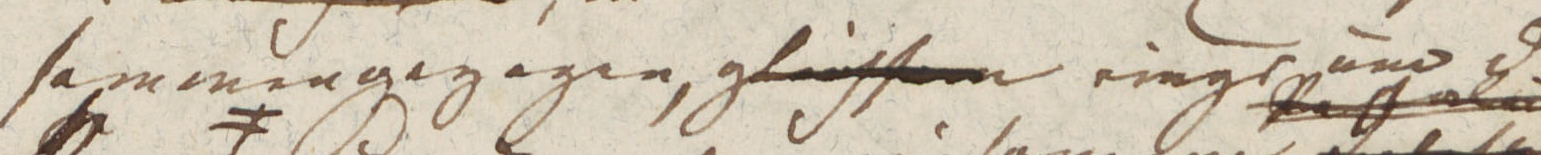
sammengezogen, gleichsam rings um den
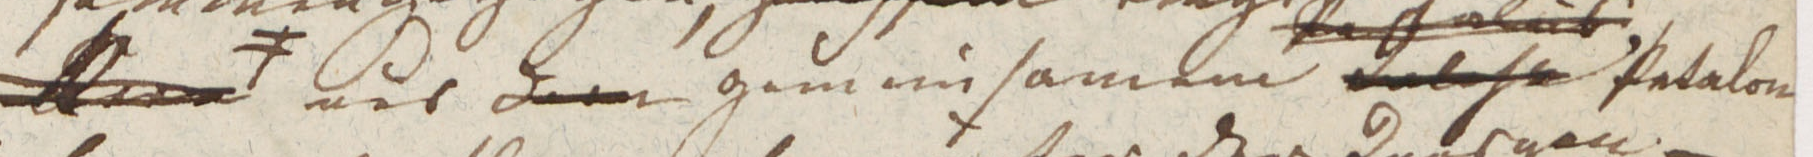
% aus dem gemeinsamem Kelche Petalus
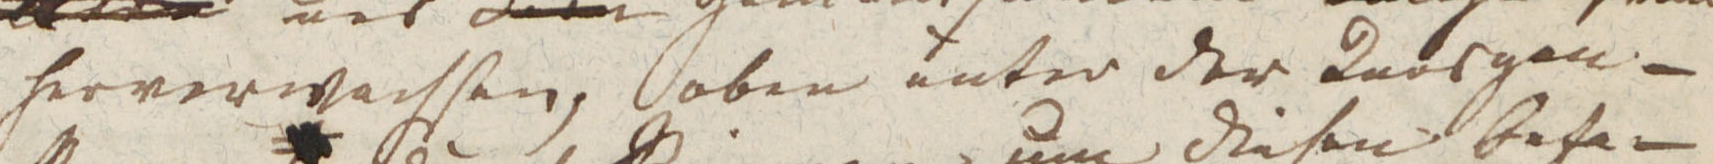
hervorwachsen, oben unter der Knospen-
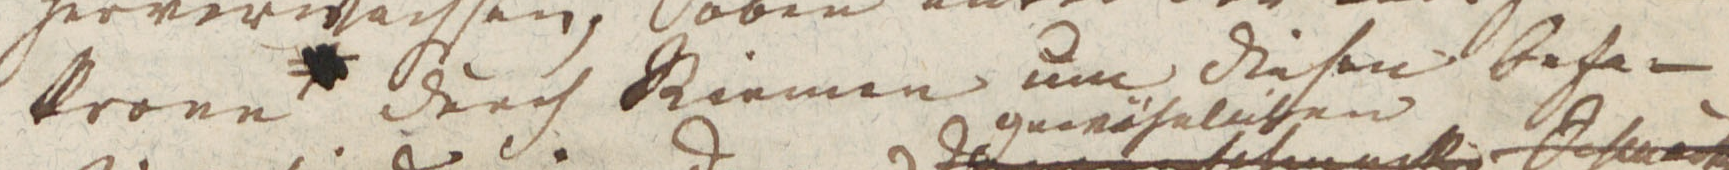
krone % durch Riemen um diesen befe-
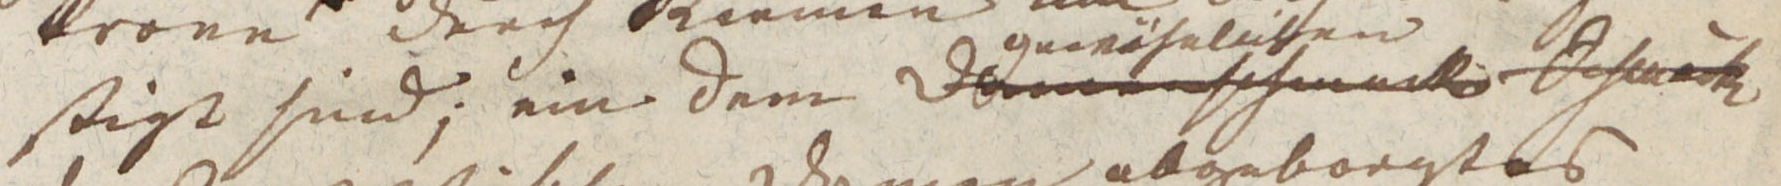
stigt sind; ein dem Damenschmuck gewöhnlichen
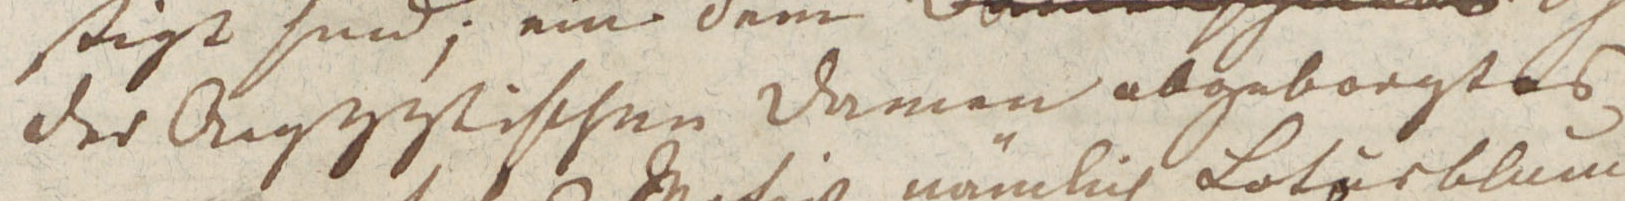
der Aegyptischen Damen abgeborgtes
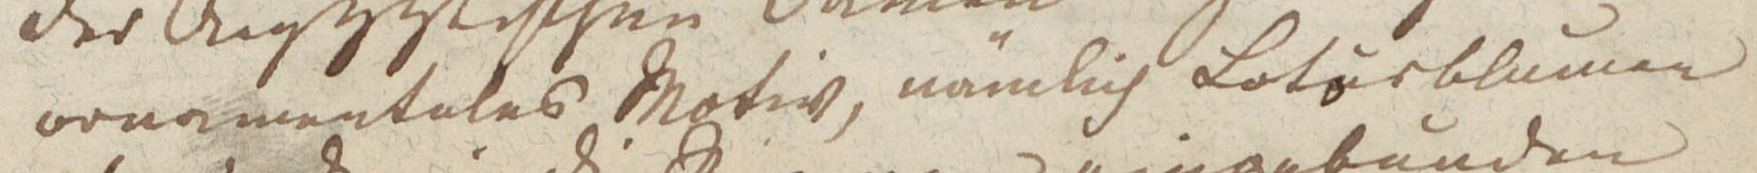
ornamentales Motiv, nämlich Lotuosblumen
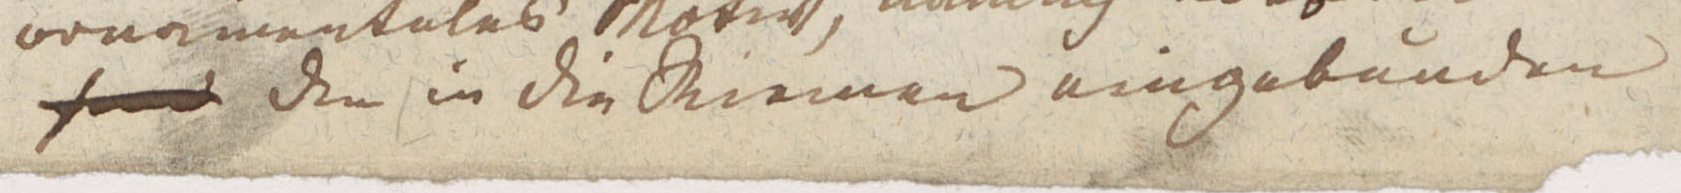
sind die in die Riemen eingebunden
